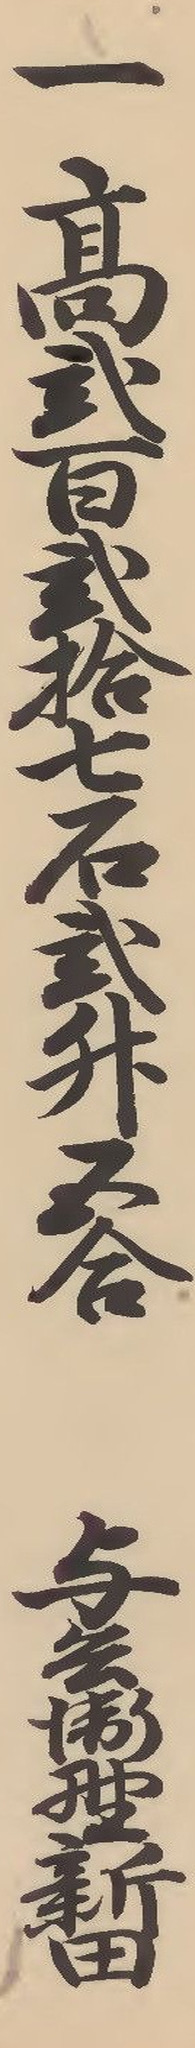一高弐百弐拾七石弐升五合与兵衛野新田
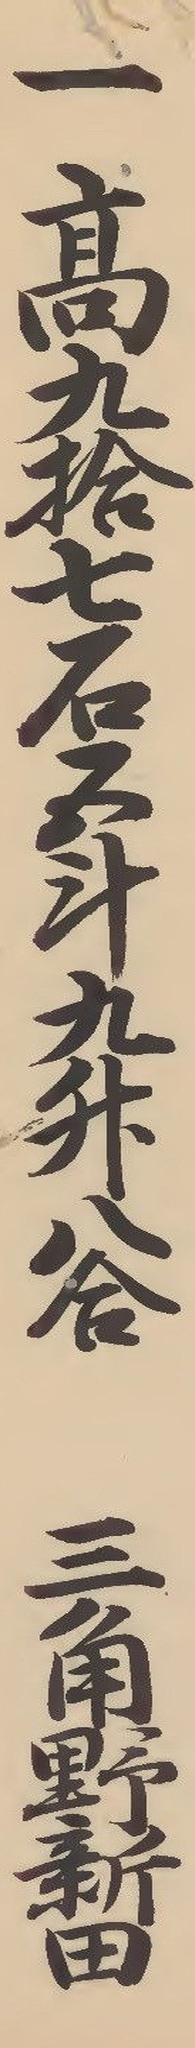一高九拾七石五斗九升八合三角野新田

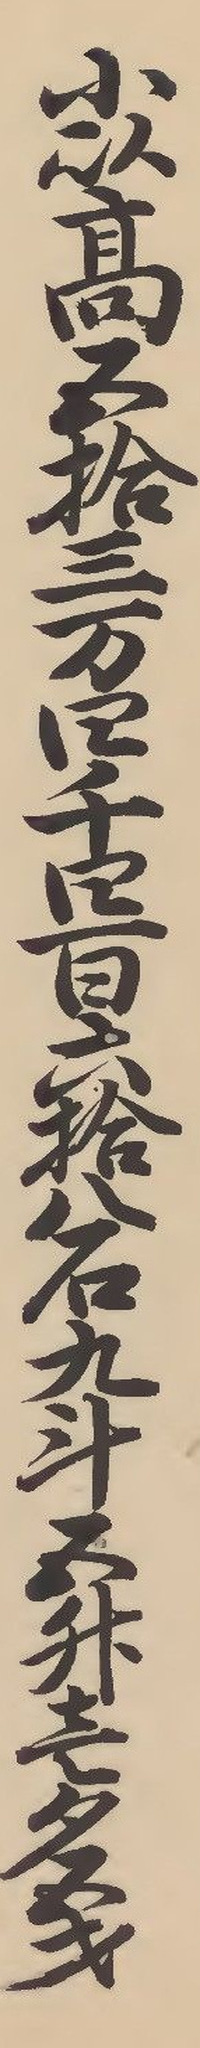小以高五拾三万四千四百六拾八石九斗五升壱勺五才
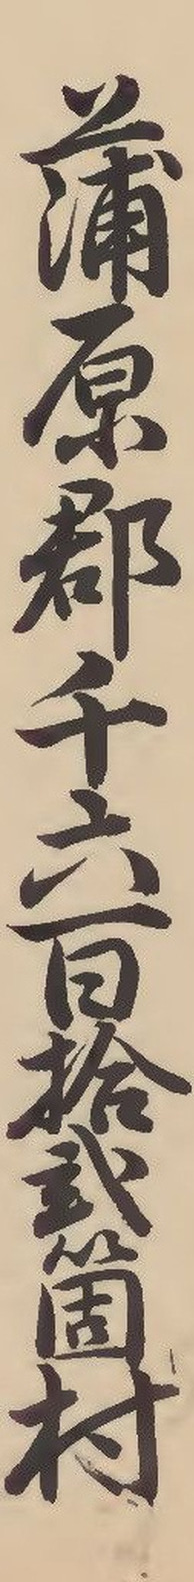蒲原郡千六百拾弐箇村
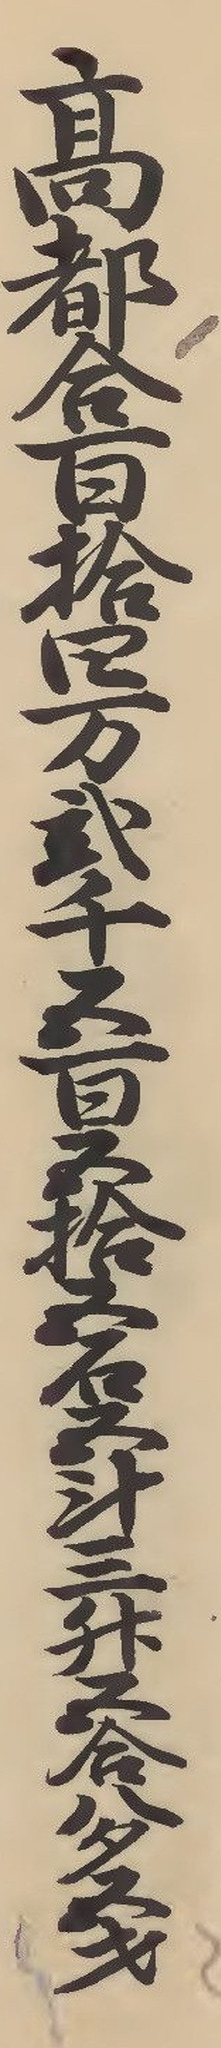高都合百拾四万弐千五百五拾五石五斗三升五合八勺五才
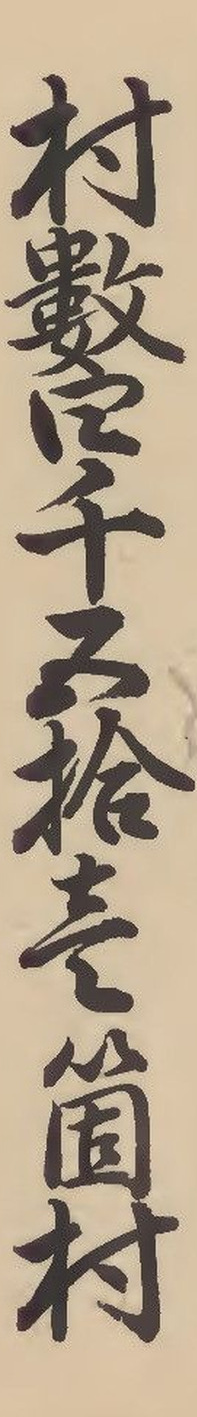村数四千五拾壱箇村

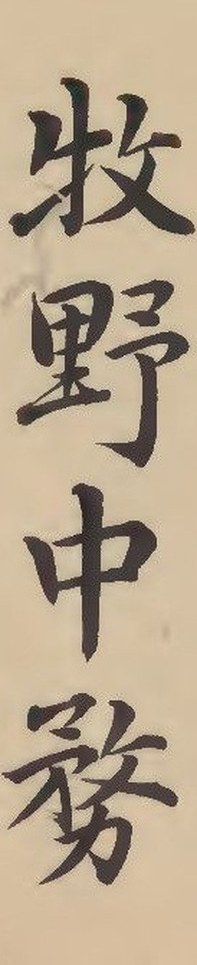枚野中務
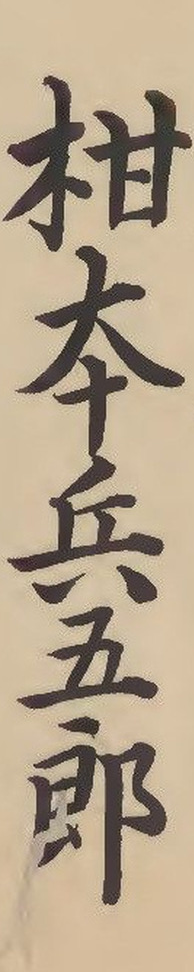柑本兵五郎
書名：越後国郷帳　下
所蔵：国立公文書館 National Archives of Japan
